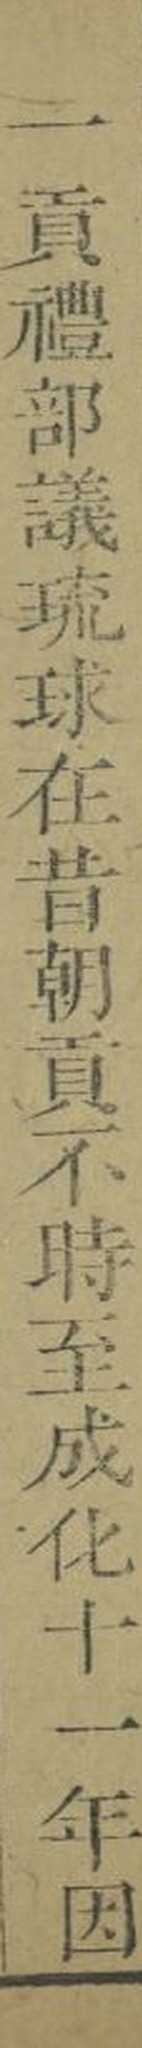一貢礼部議琉球在昔朝貢不時至成化十一年因
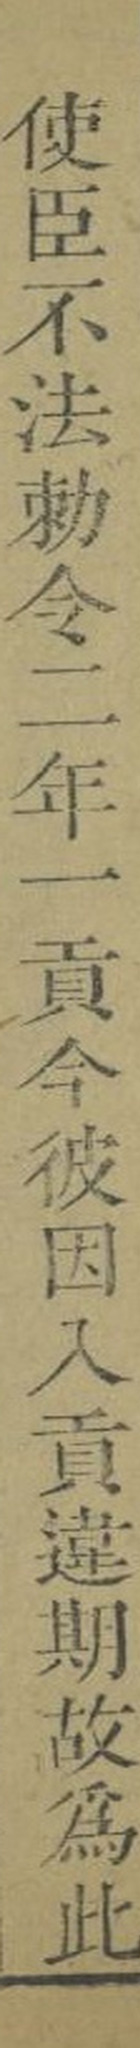使臣不法勅令二年一貢今彼因入貢違期故為此
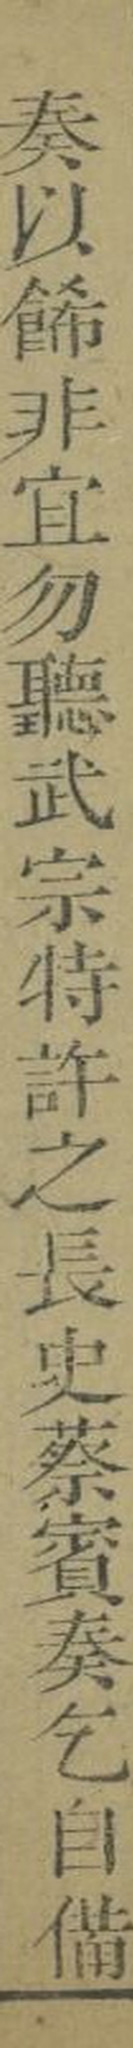奏以飾非宜勿聴武宗特許之長史蔡賓奏乞自備
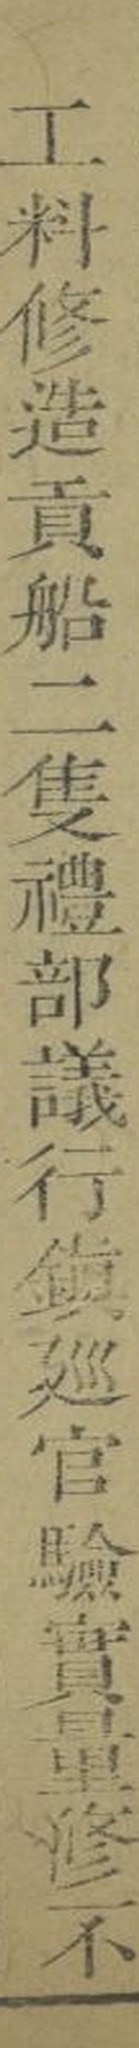工料修造貢船二隻礼部議行鎮巡官験実量修不
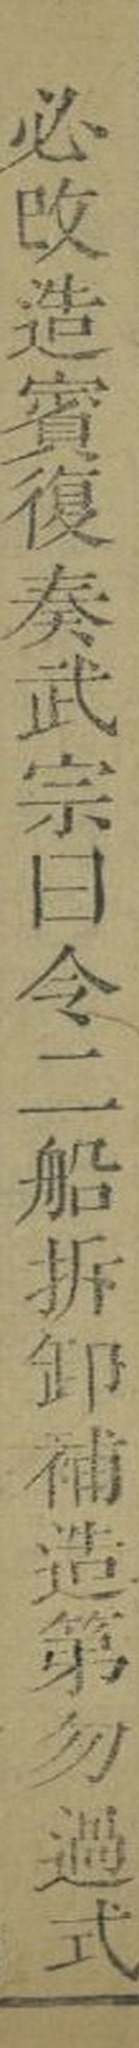必改造賓復奏武宗曰令二船拆卸補造第勿過式
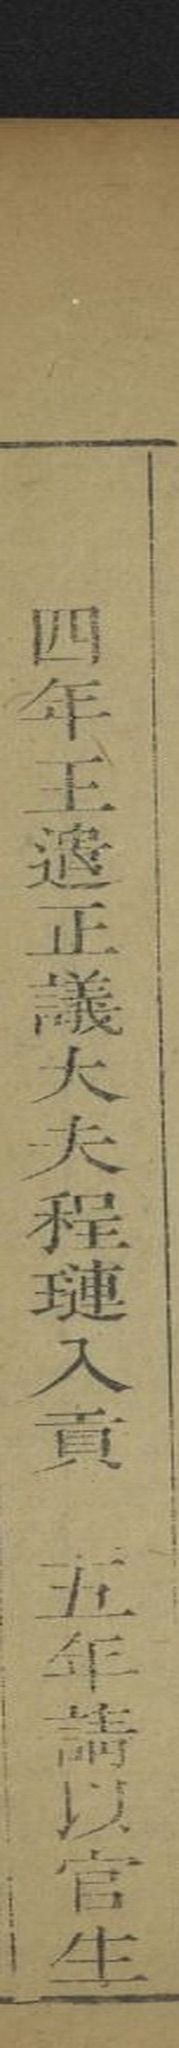四年王遣正議大夫程璉入貢五年請以官生
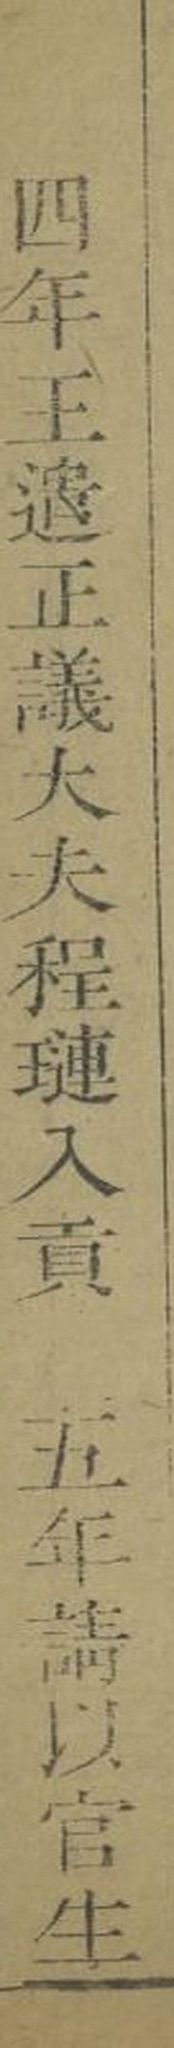四年王遣正議大夫程璉入貢五年請以官生
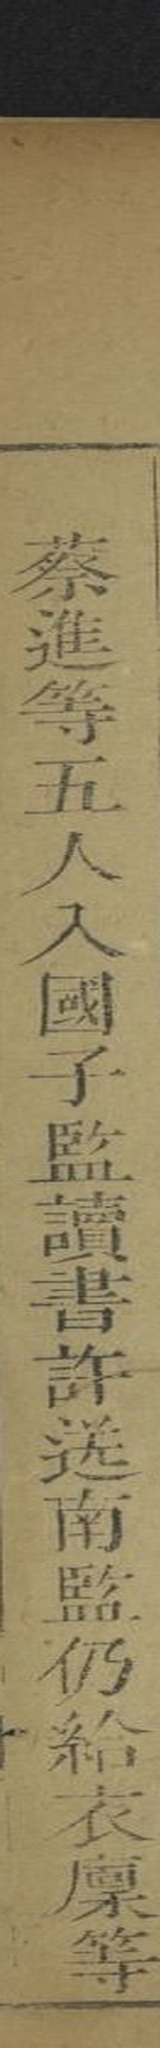蔡進等五人入国子監読書許送南監仍給衣廩等
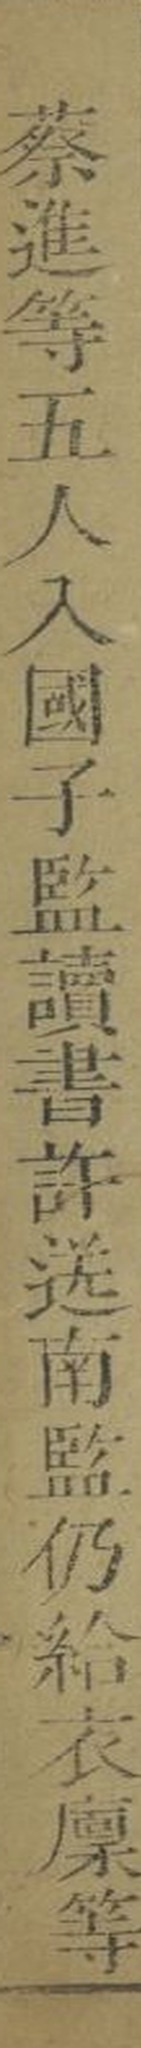蔡進等五人入国子監読書許送南監仍給衣廩等

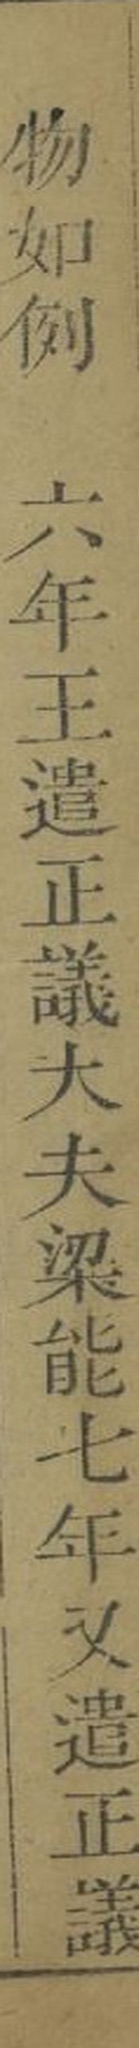物如例六年王遣正議大夫梁能七年又遣正議
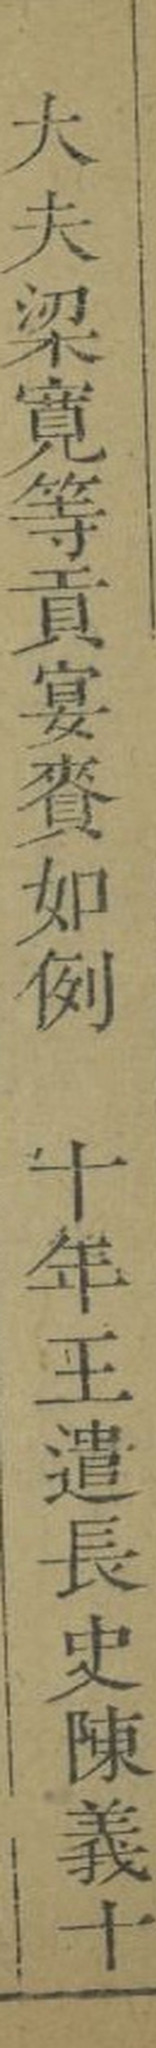大夫梁寛等貢宴賚如例十年王遣長史陳義十
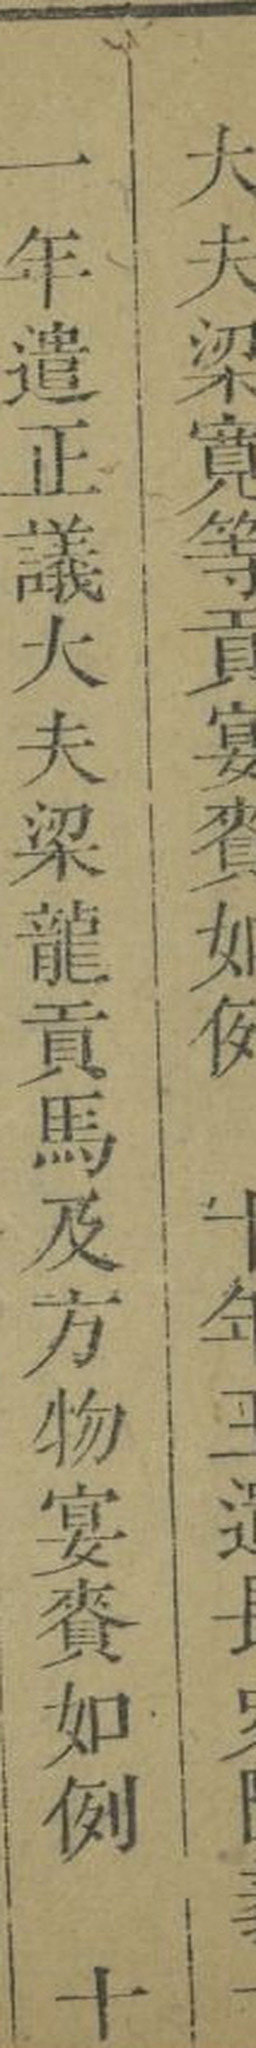一年遣正議大夫梁竜貢馬及方物宴賚如例十
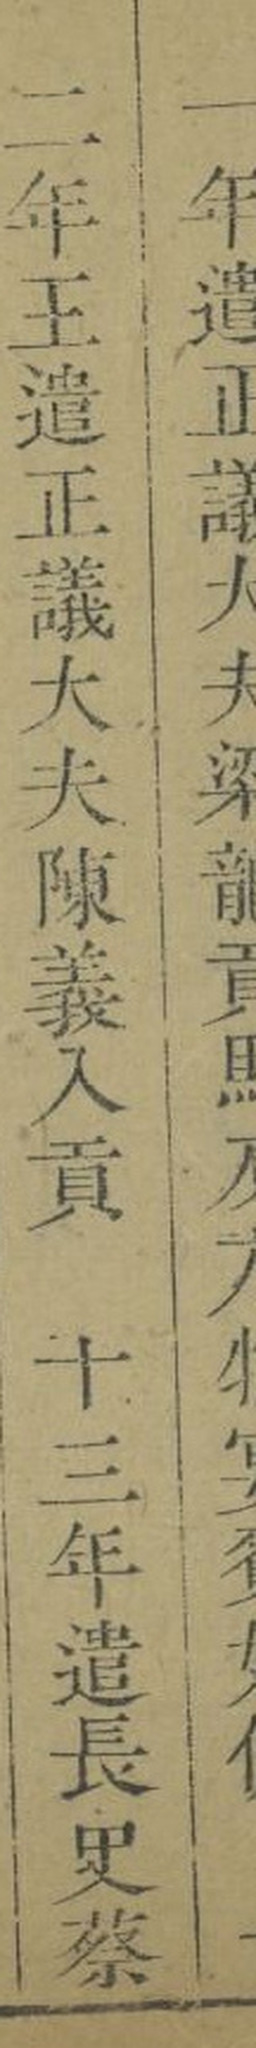二年王遣正議大夫陳義入貢十三年遣長史蔡
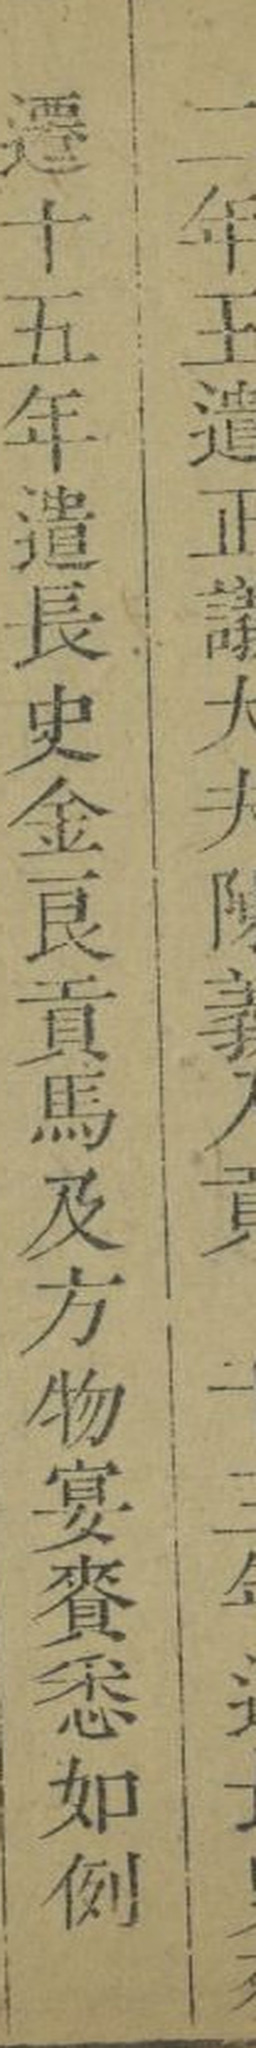遷十五年遣長史金良貢馬及方物宴賚悉如例
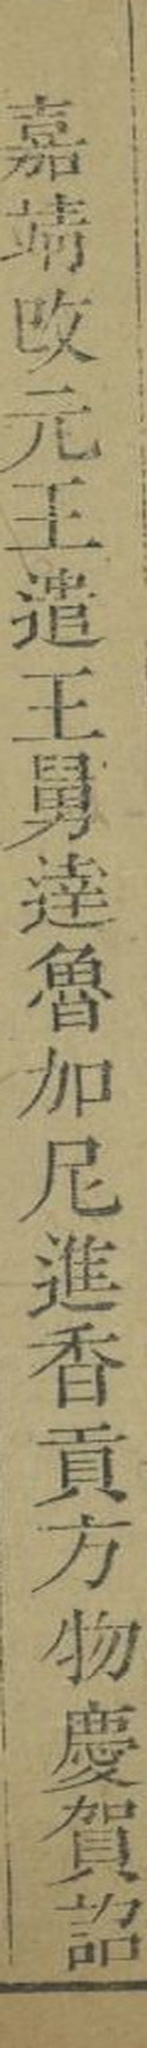嘉靖改元王遣王舅達魯加尼進香貢方物慶賀詔
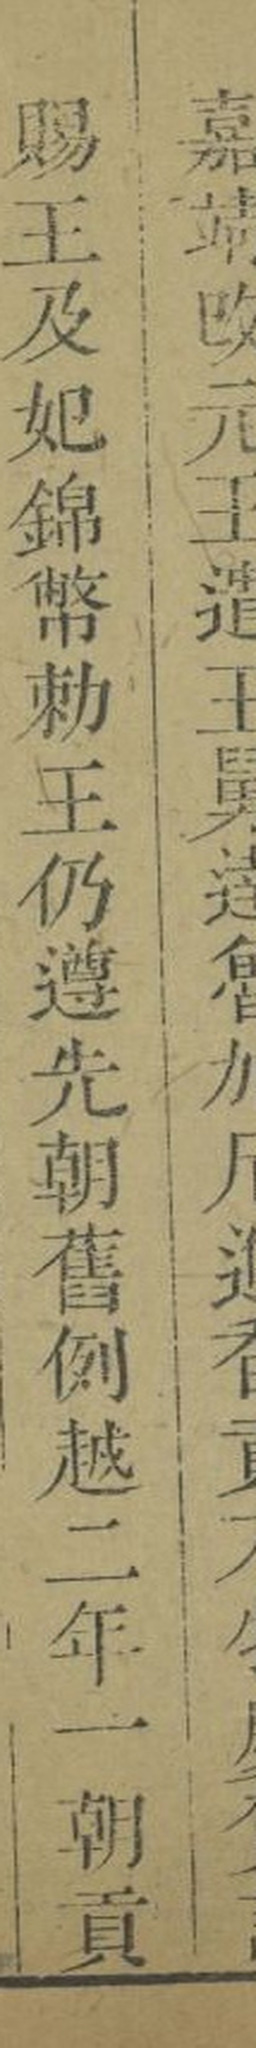賜王及妃錦幣勅王仍遵先朝旧例越二年一朝貢
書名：中山伝信録 巻三
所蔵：University of the Ryukyus Library
